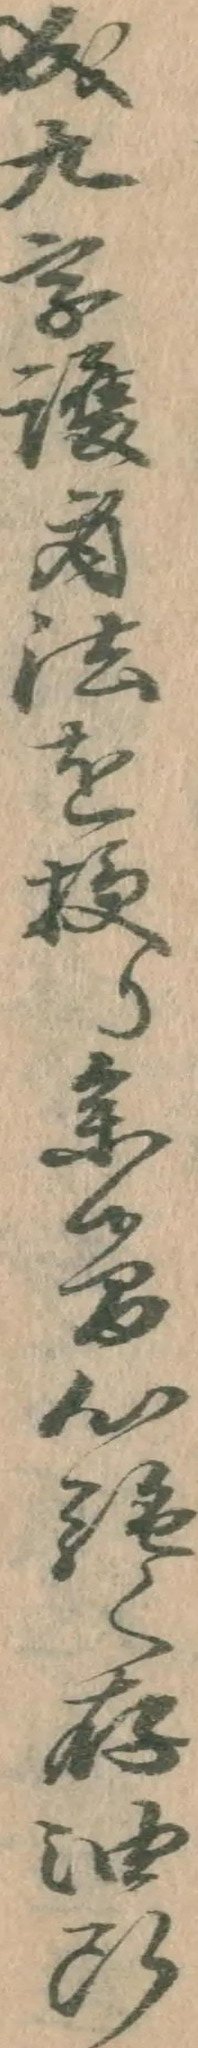成九字護身法を授り参候間心強く存油断
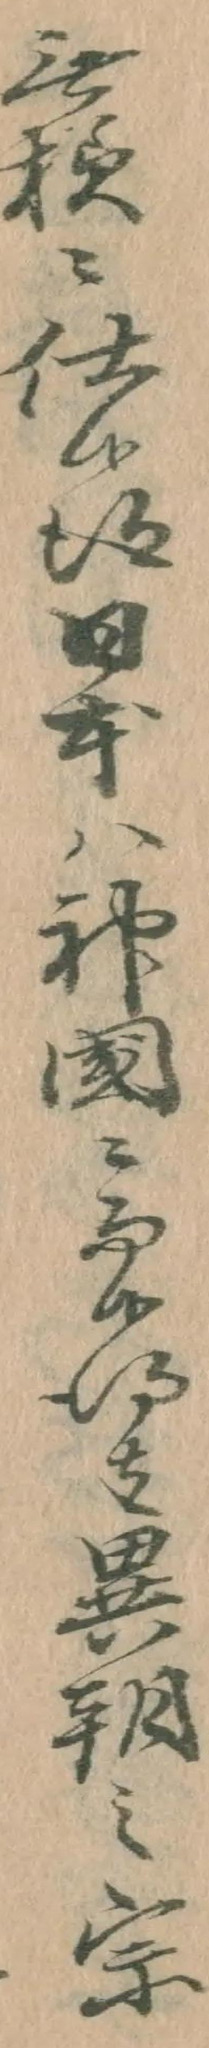無様に仕様得日本は神国に而候得は異朝之宗
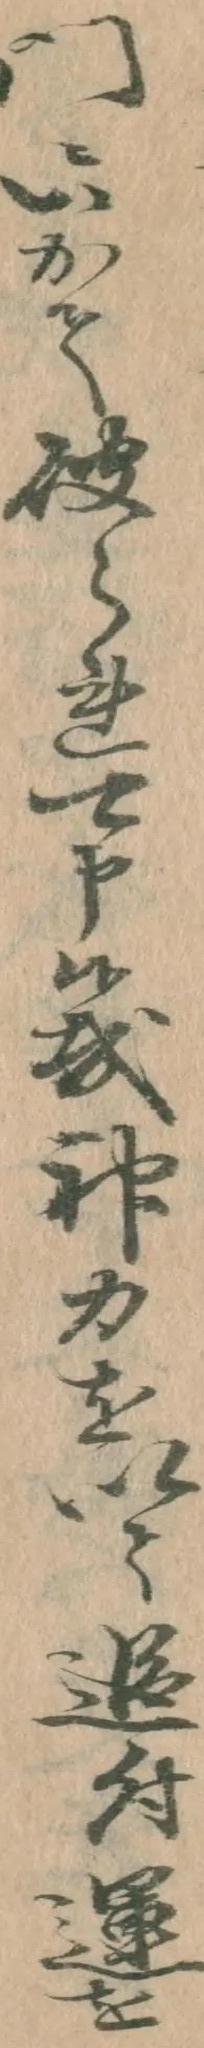門にいかて破られ可申候哉神力を以て追付運を
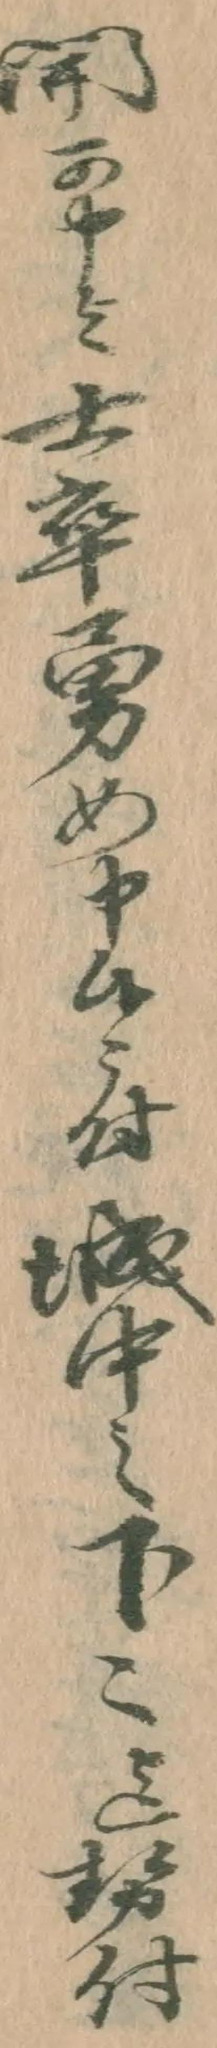開可申と士卒勇め申候に付城中之下々迄勢付
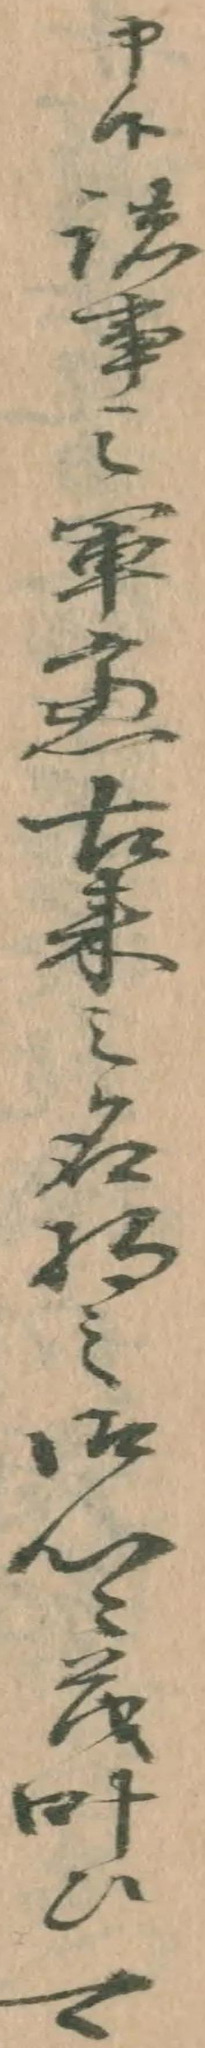申候諸事之軍慮古来之名将之御心にも叶ひ可
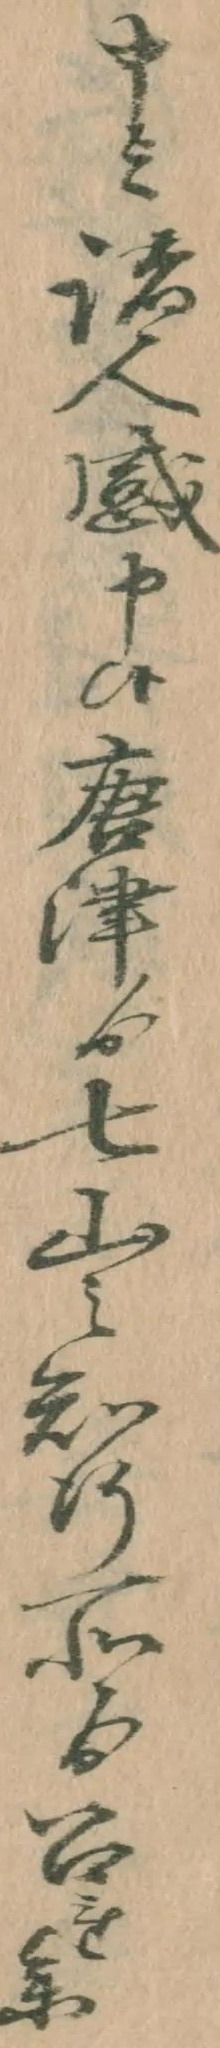申と諸人感申候唐津ゟ七山之知行所ゟ召連参
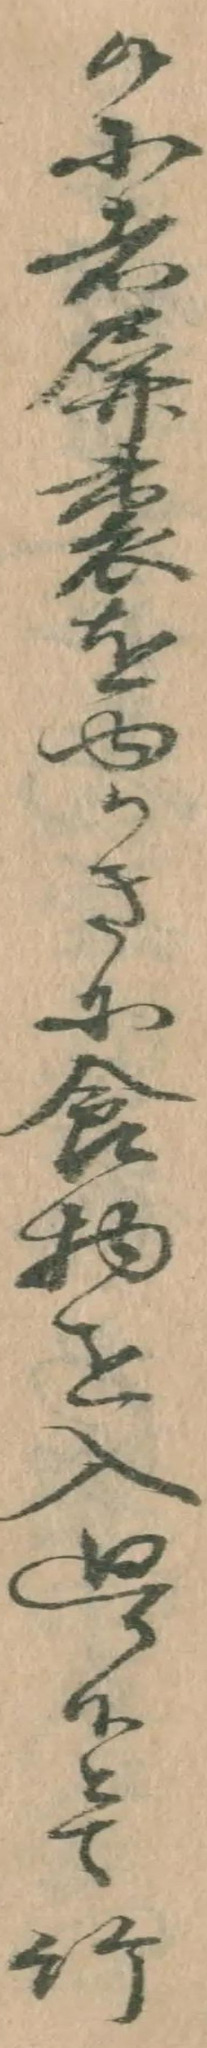候小者屏裏をゆかきに食物を入廻り候とて竹
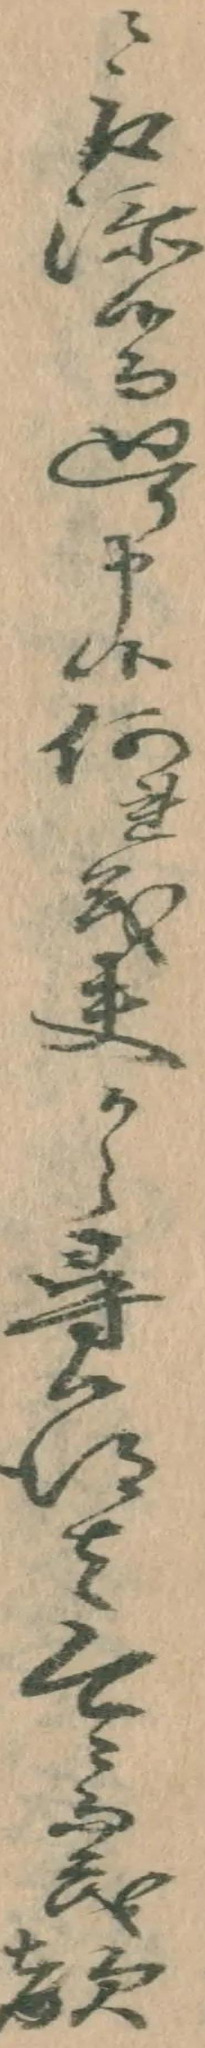に取添候而廻り申候何れも夫から尋候得は今に而も敵
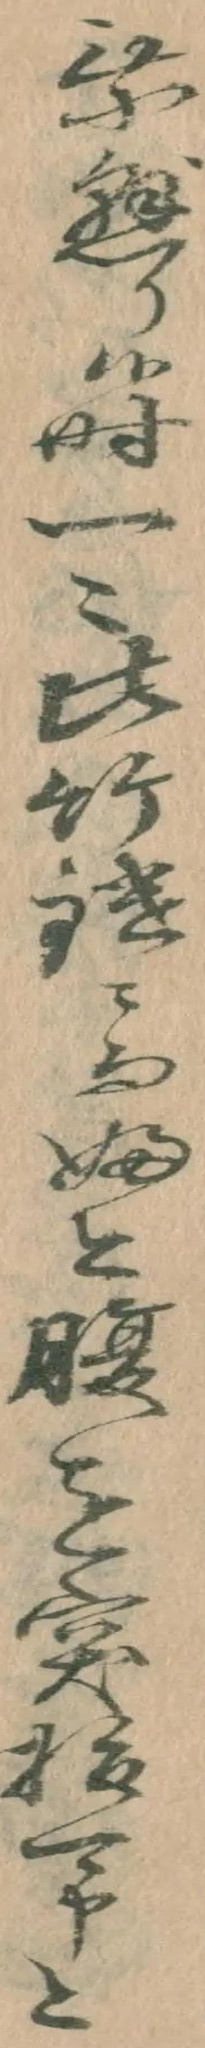乗懸り候時一々此竹鑓に而ふと腹を突抜可申と
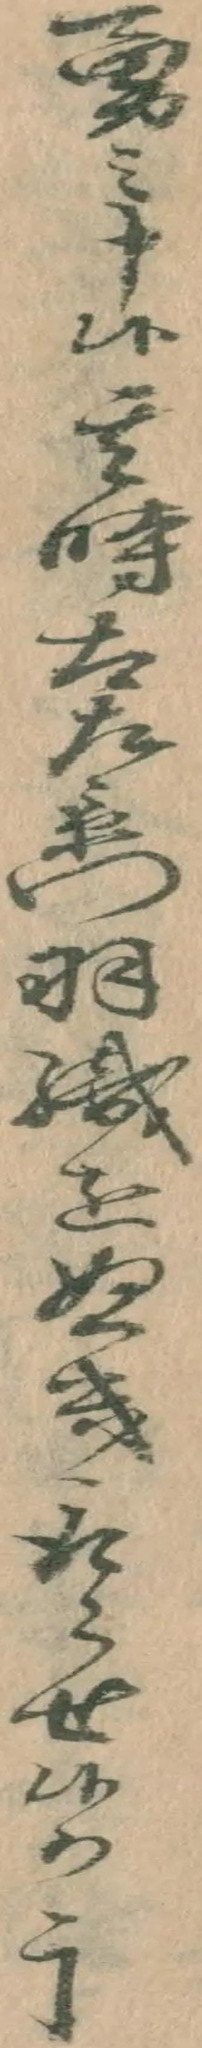勇み申候其時太左衛門羽織をぬき取らせ候
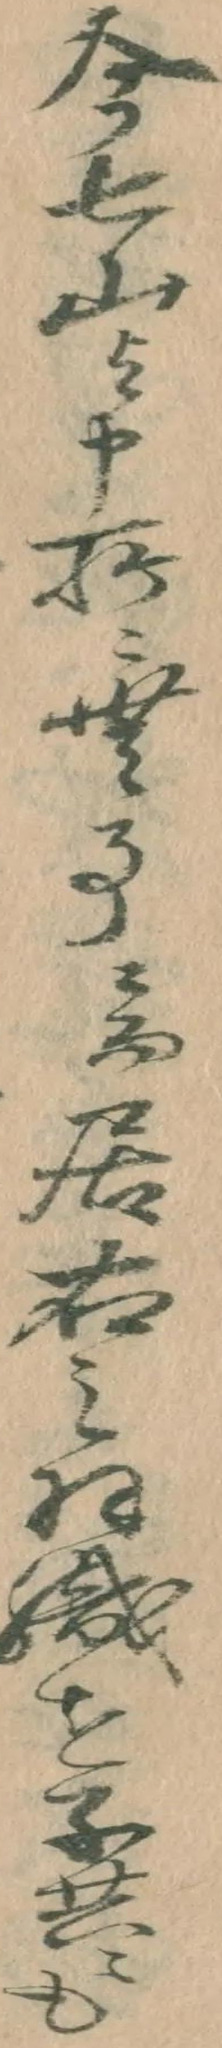今七山と申所に無事に而居右之羽織を子共にも
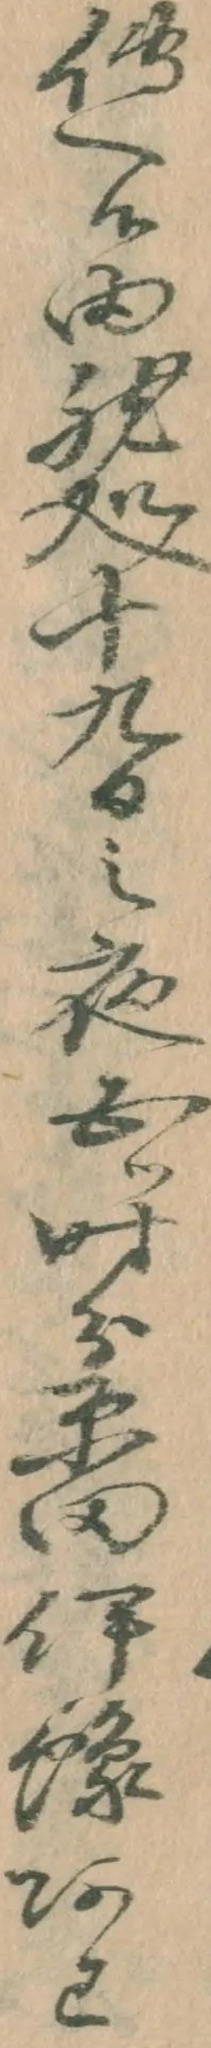伝へ候由然処十九日之夜五ッ時分原田伊予あわ
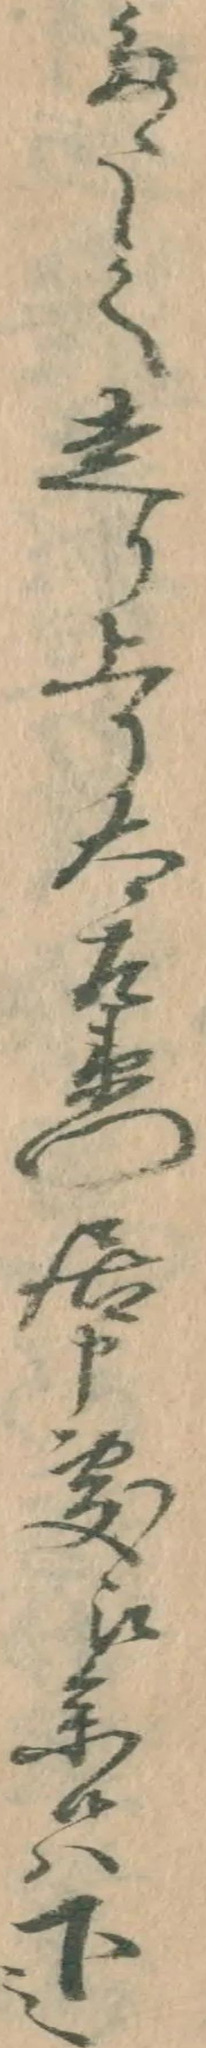たゝしく走り上り太左衛門居申処江参候は下之

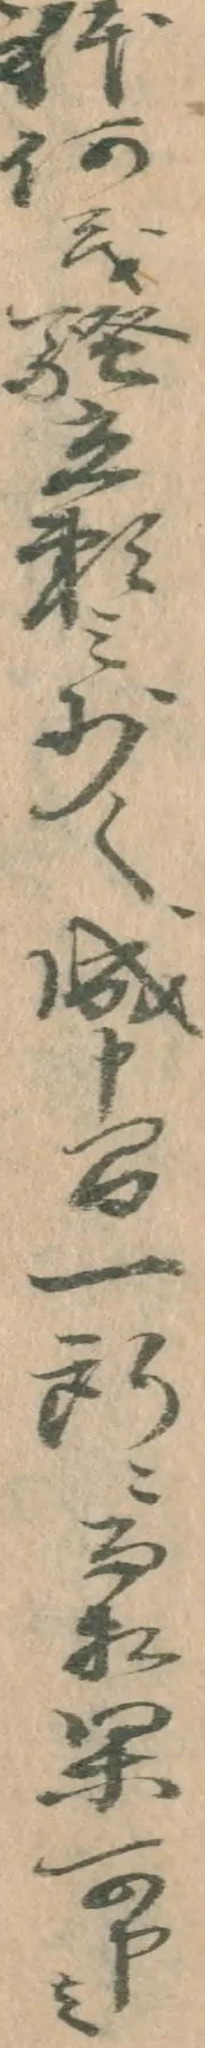体何も騒立頼み少く成申間一所に而相果可申と
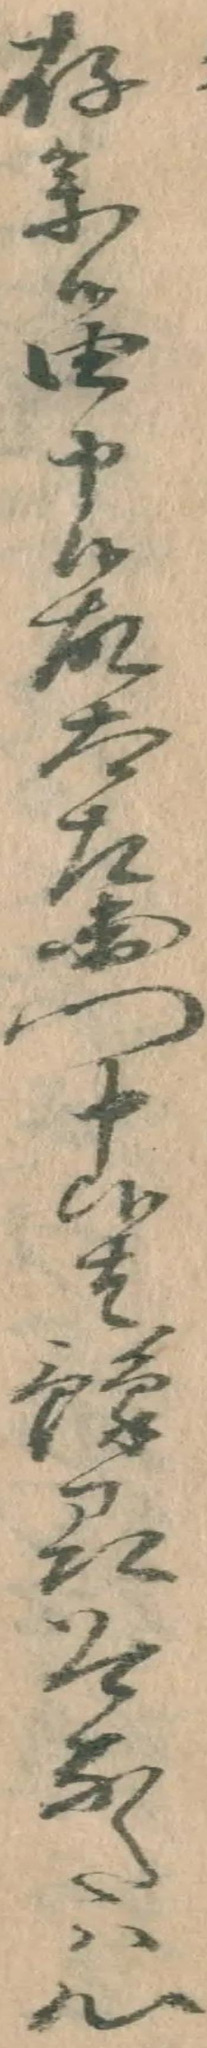存参候由申候故太左衛門申候は予州そなたは心
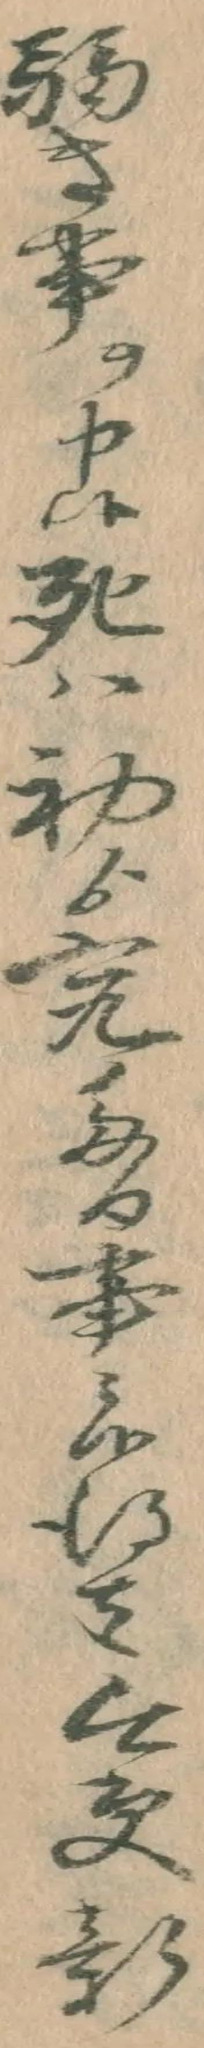弱き事ヲ申候死は初ゟ究たる事に候得は今更新
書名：切支丹御退治記 49巻. [3]
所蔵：国立国会図書館 National Diet Library, JAPAN
